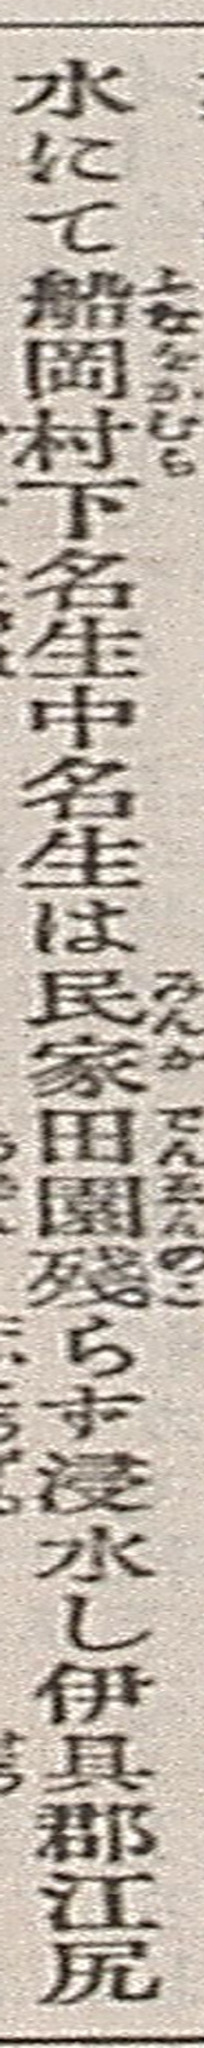水にて船岡村下名生中名生は民家田園残らず浸水し伊具郡江尻
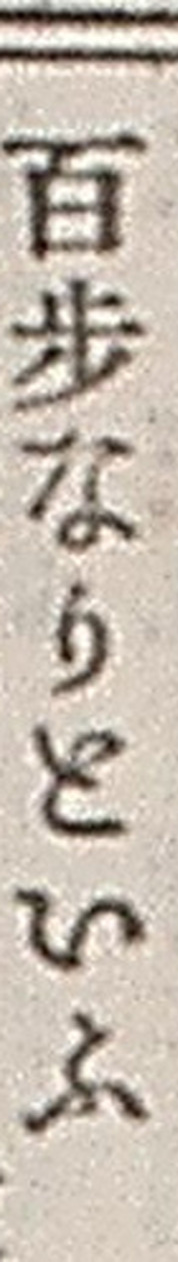百歩なりといふ
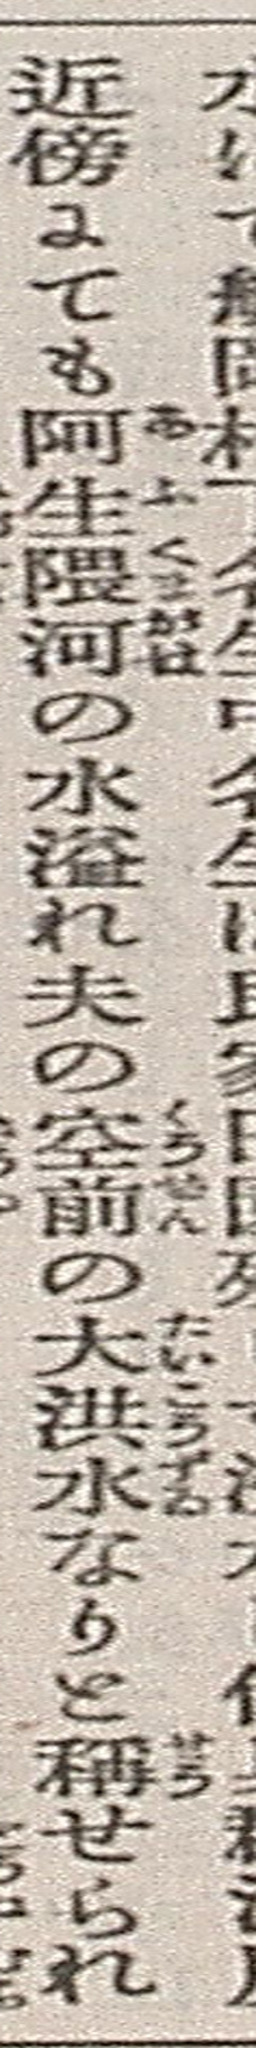近傍にても阿生隈河の水溢れ夫の空前の大洪水なりと称せられ
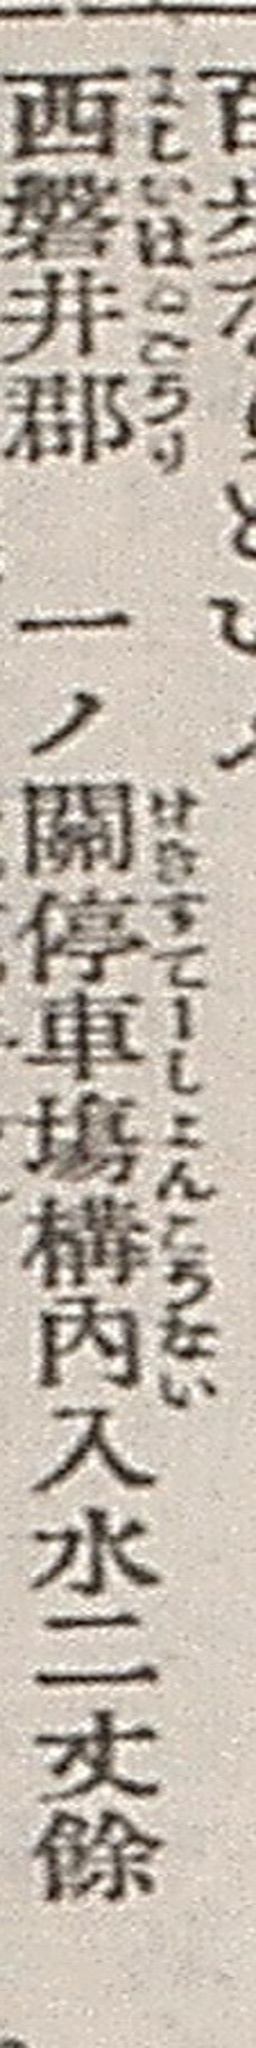西盤井郡一ノ関停車場構内入水二丈餘
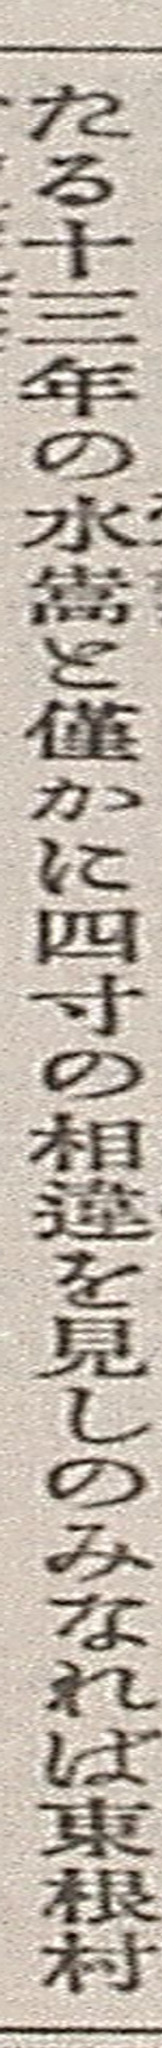たる十三年の水嵩と僅かに四寸の相違を見しのみなれば東根村
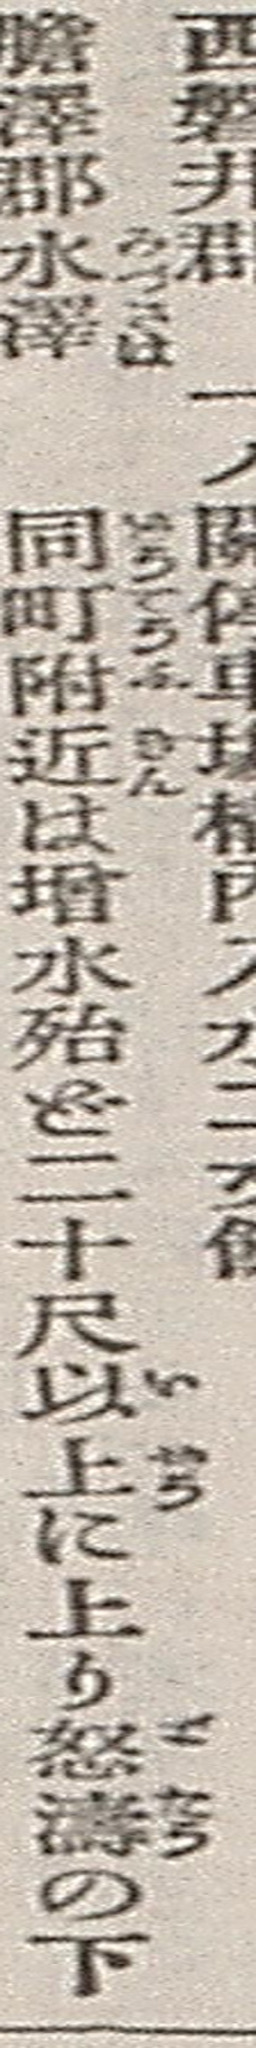膽沢郡水沢同町附近は増水殆ど二十尺以上に上り怒濤の下
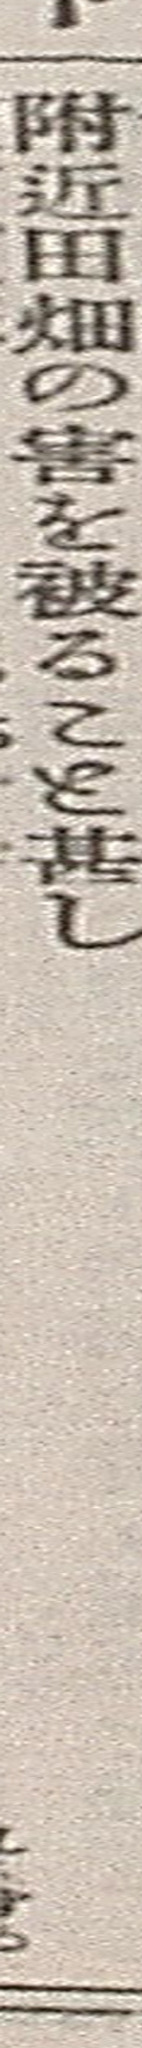附近田畑の害を被ること甚し
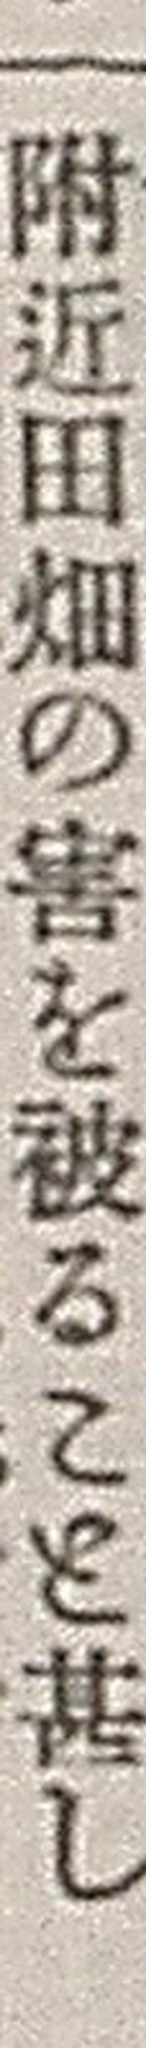附近田畑の害を被ること甚し
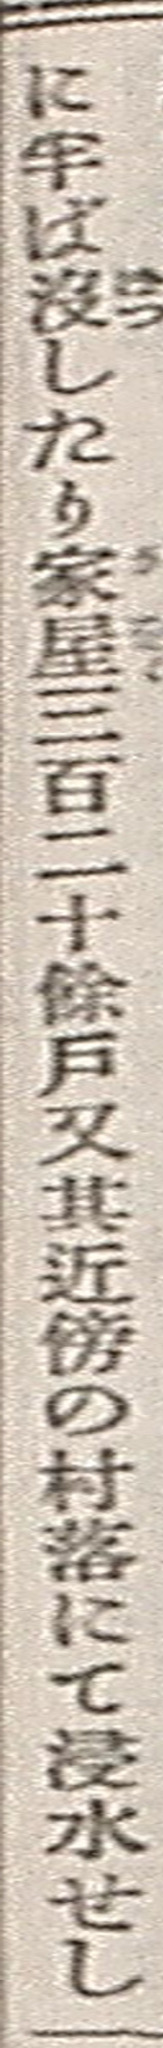に半ば没したり家屋三百二十餘戸又其近傍の村落にて浸水せし
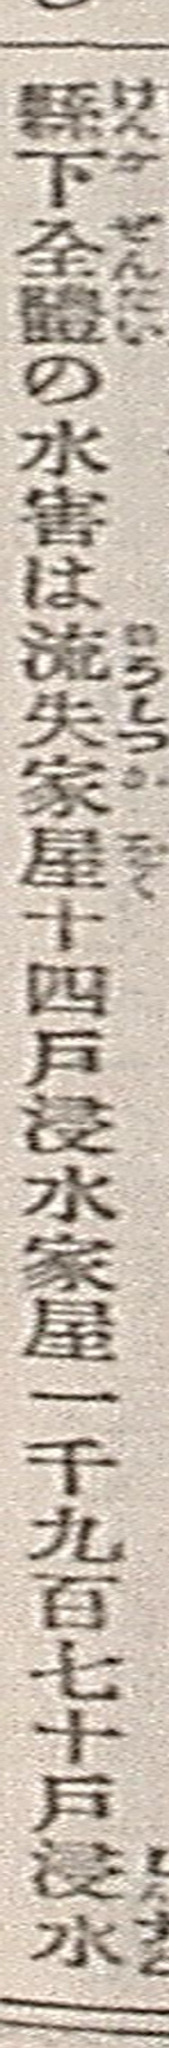県下全体の水害は流失家屋十四戸浸水家屋一千九百七十戸浸水
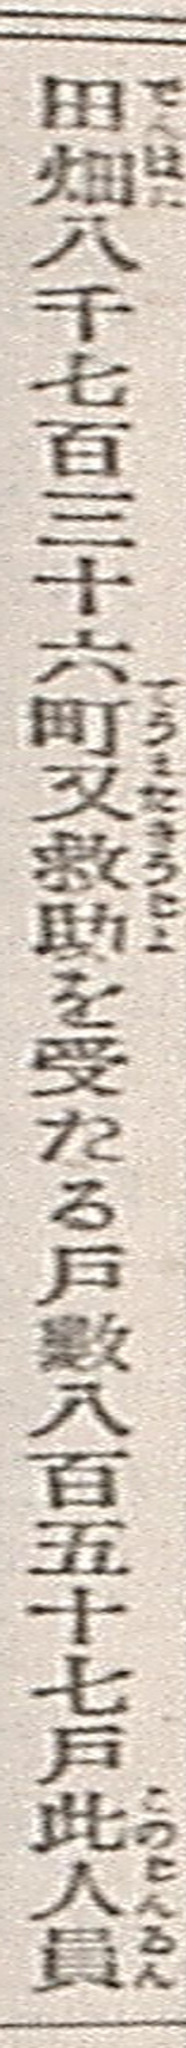田畑八千七百三十六町又救助を受たる戸数八百五十七戸此人員
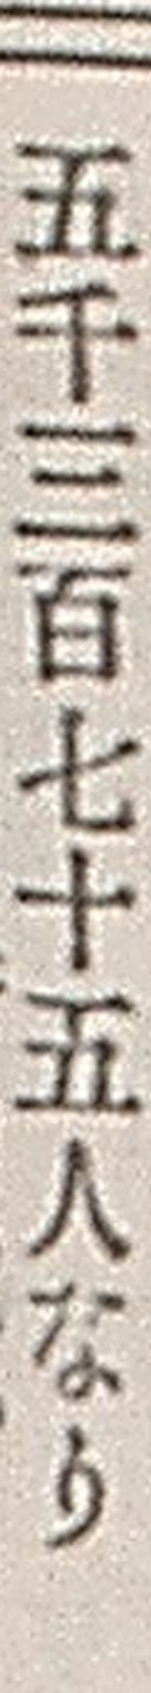五千三百七十五人なり
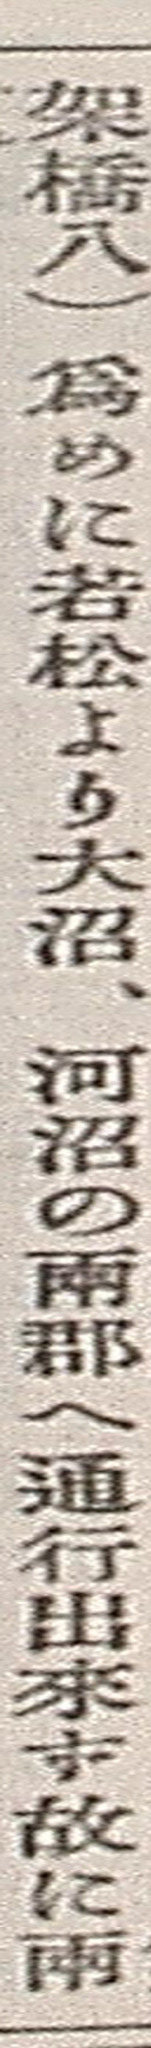架橋八）為めに若松より大沼、河沼の両郡へ通行出来ず故に両
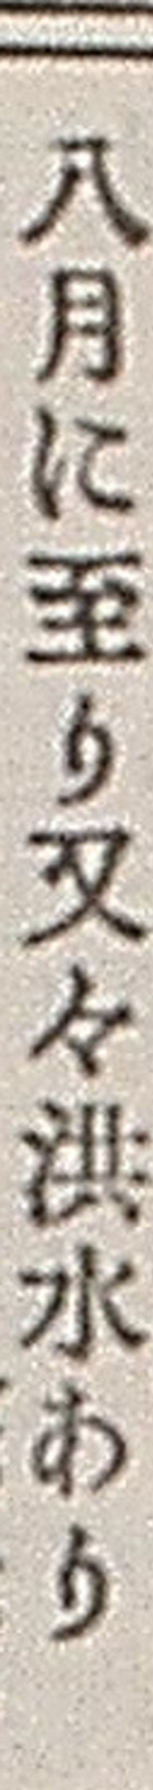八月に至り又々洪水あり
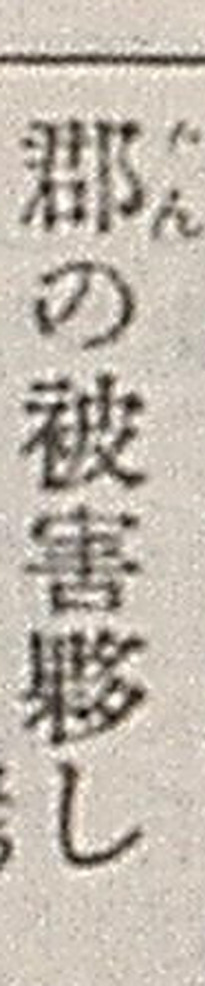郡の被害夥し
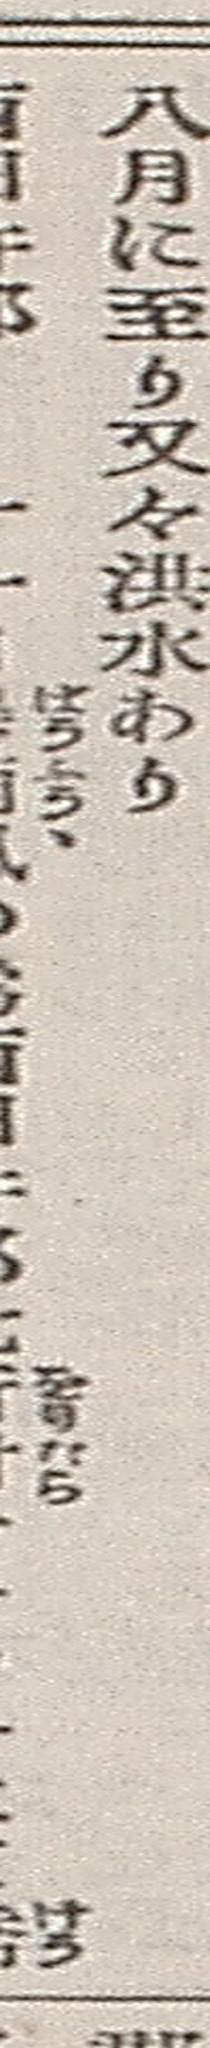八月に至り又々洪水あり
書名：風俗畫報臨時増刊第百二十八號　洪水被害録（下）
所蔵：東京大学地震研究所図書室 Earthquake Research Institute Library, The University of Tokyo, JAPAN
